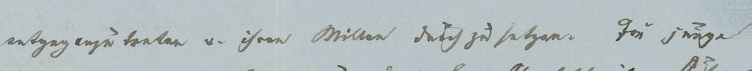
entgegenzutreten &. ihren Willen durchzusetzen. Die junge
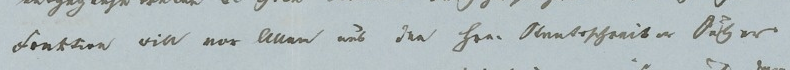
Fraktion will vor Allem aus den Hrn. Staatsschreiber Sulzer
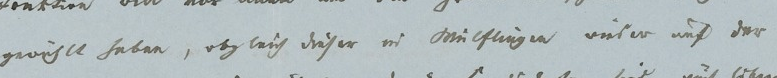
gewählt haben, obgleich dieser in Wülflingen wieder auf der
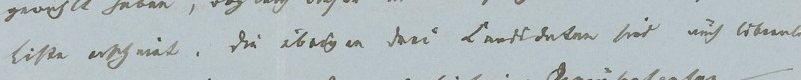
Liste erscheint. Die übrigen drei Candidaten sind auch liberale
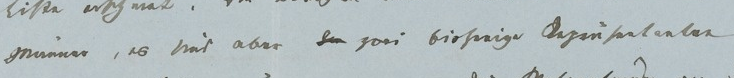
Männer, es sind aber zwei bisherige Repräsentanten
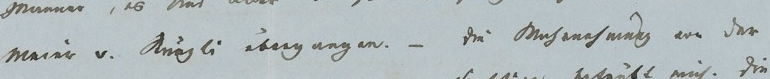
Meier &.Künzli übergangen. – Die Wahrnehmung von der
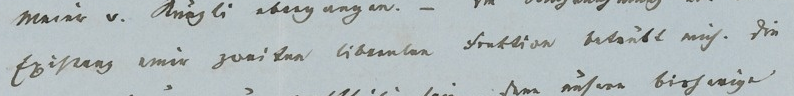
Existenz einer zweiten liberalen Fraktion betrübt mich. Die
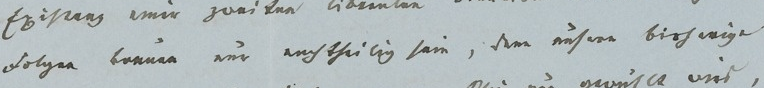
Folgen können nur nachtheilig sein, denn unsere bisherige
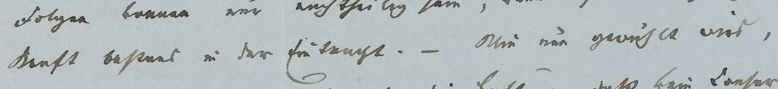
Kraft bestand in der Eintracht. – Wie nun gewählt wird,
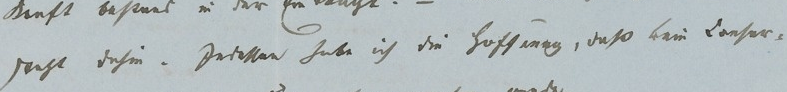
steht dahin. Indessen habe ich die Hoffnung, daß kein Conser-
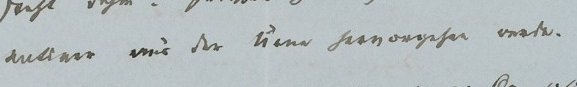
vativer aus der Urne hervorgehen werde.
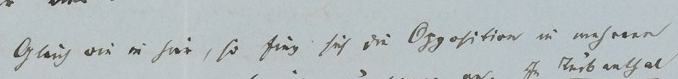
Gleich wie in hier, so fing sich die Opposition in mehrern
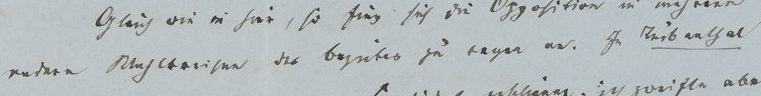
andern Wahlkreisen des Bezirkes zu regen an. In Turbenthal
